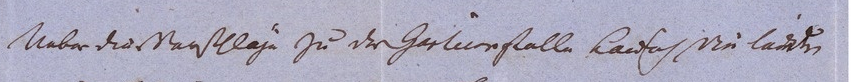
Ueber die Vorschläge zu der Gärtnerstelle kann ich Dir leider
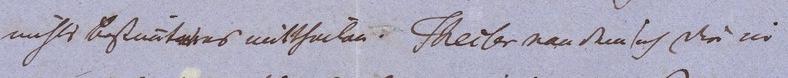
nichts Bestimmteres mittheilen. Theiler von dem ich Dir in
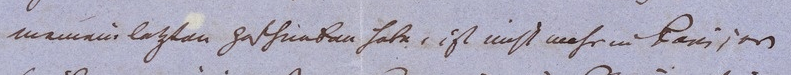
meinem letzten geschrieben habe, ist nicht mehr in Paris ; er
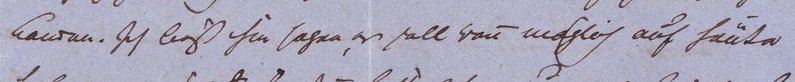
kommen. Ich ließ ihm sagen, er soll wenn möglich auf heute
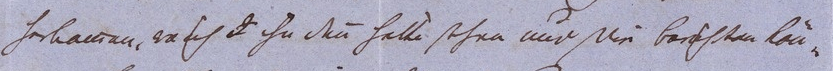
herkommen, wo ich ihn denn hätte sehen und Dir berichten kön-
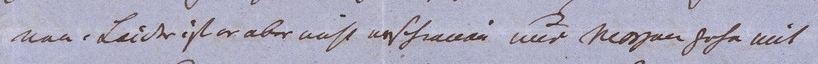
nen. Leider ist er aber nicht erschienen und morgen gehe mit
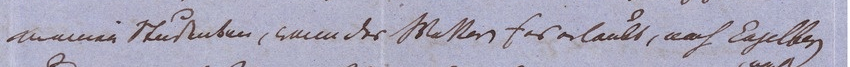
meinen Studenten, wenn das Wetter es erlaubt, nach Engelberg
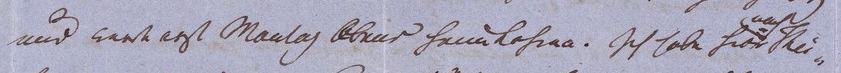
und werde erst Montag Abend heimkehren. Ich habe hier nachThei-
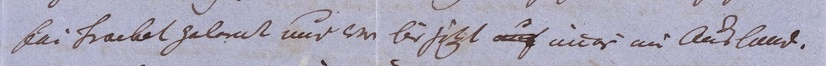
bei Trachel gelernt und war bis jetzt ... immer im Ausland.
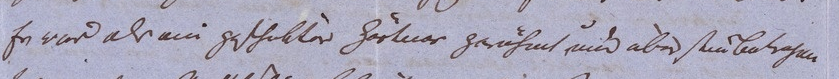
Er wird als ein geschickter Gärtner gerühmt und über sein Betragen
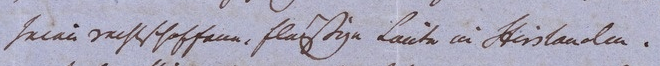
seien rechtschaffene, fleißige Leute in Hirslanden.
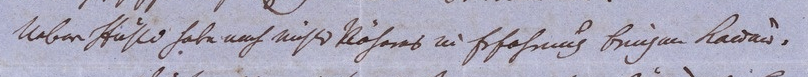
Ueber Hüsser habe mich nichts Näheres in Erfahrung bringen können.
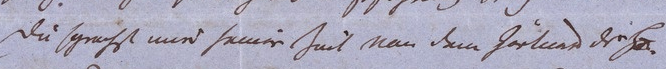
Du sprachst mir seiner Zeit von dem Gärtner der Hr.
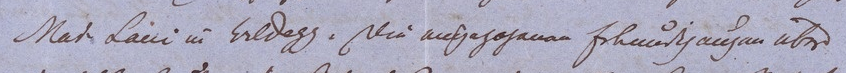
Mad. Laui in Waldegg. Die eingezogenen Erkundigungen über
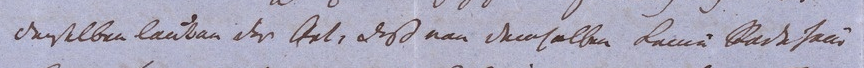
denselben lauten der Art, saß von demselben keine Rede sein
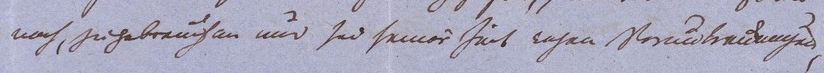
nach, zu gebrauchen und sei seiner Zeit wegen Veruntreuungen,
